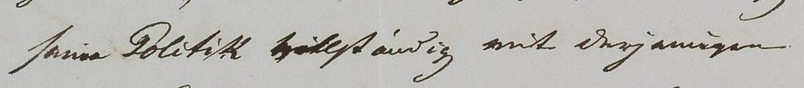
seine Politik vollständig mit derjenigen
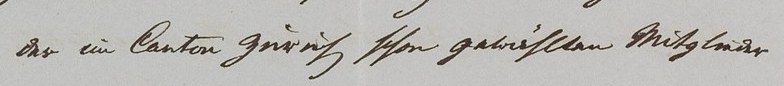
der im Canton Zürich schon gewählten Mitglieder
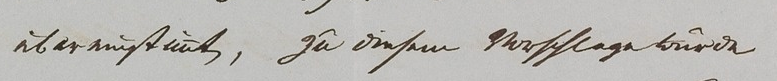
übereinstimmt, zu diesem Vorschlage wurde
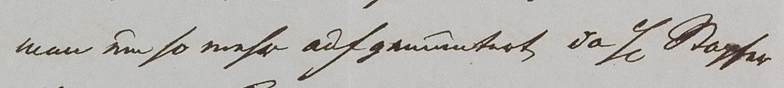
man um so mehr aufgemuntert, da Hr. Stapfer
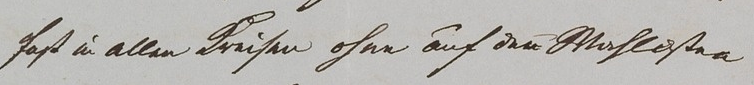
fast in allen Kreisen ohne auf den Wahllisten
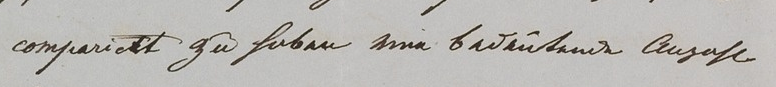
compariert zu haben eine bedeutende Anzahl
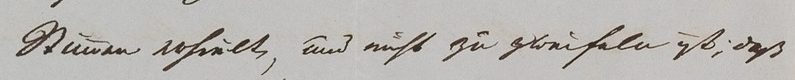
Stimmen erhielt, und nicht zu zweifeln ist, daß
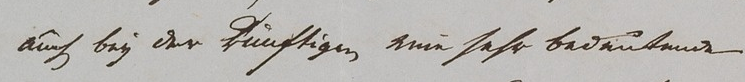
auch bey der künftigen eine sehr bedeutende
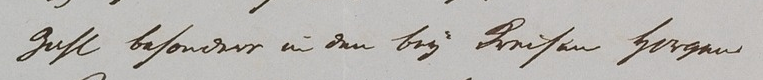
Zahl besonders in den beyden Kreisen Horgen
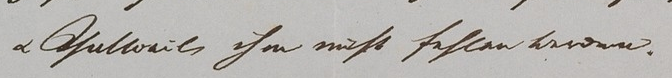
& Thalweil ihm nicht fehlen werden.
